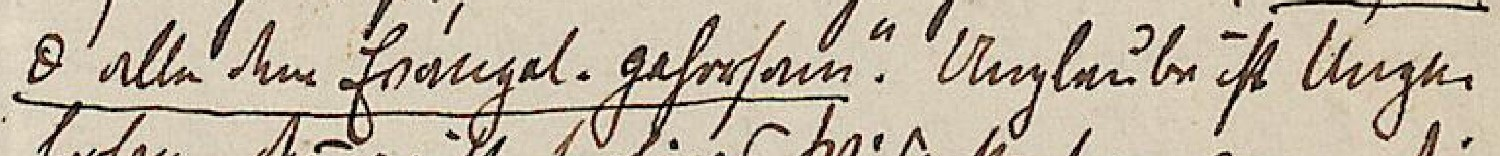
o alle dem Evangel. gehorsam." Unglaube ist Unge¬
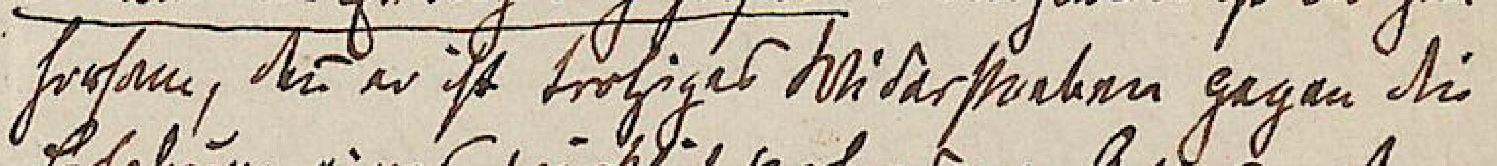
horsam, den er ist trotzigs Widerstreben gegen die
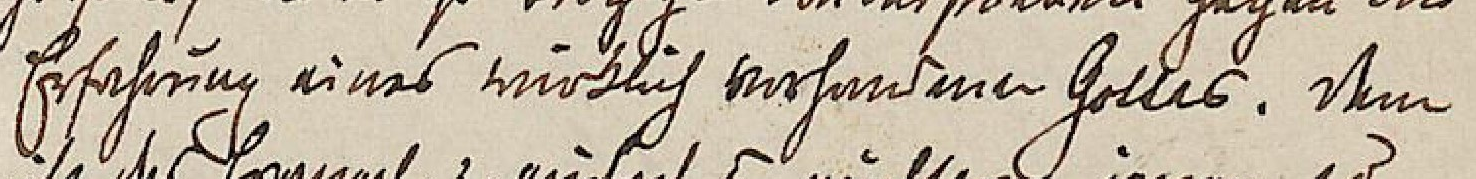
Erfahrung eines wirklich vorhandenen Gottes. Dem
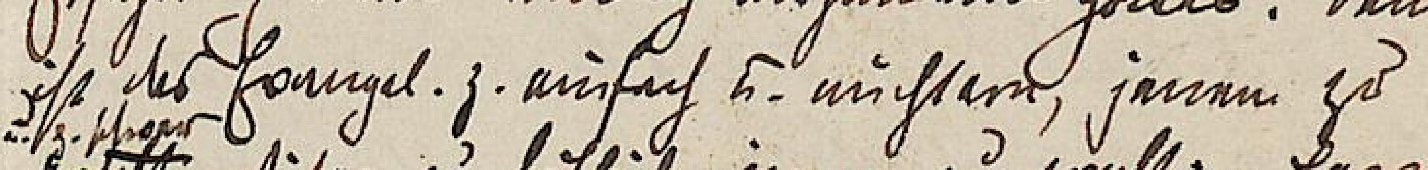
ist das Evangel. z. einfach u. nüchtern, jenem zu
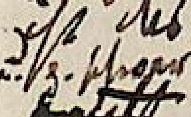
u. z. schwer
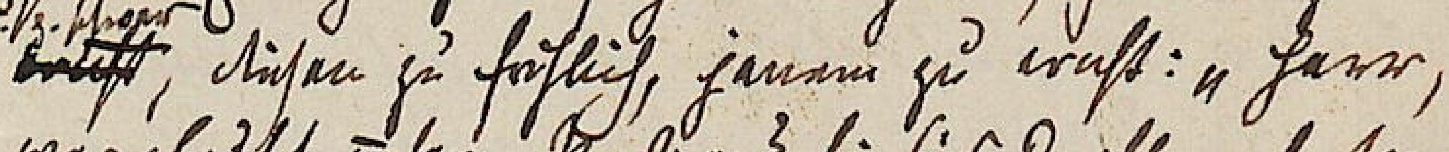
ernst, diesen zu fröhlich, jenen zu ernst: "Herr,
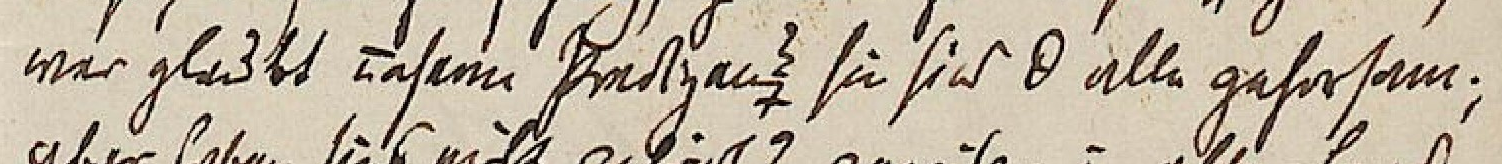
wer glaubt unserem Predigen? sie sind o alle gehorsam;
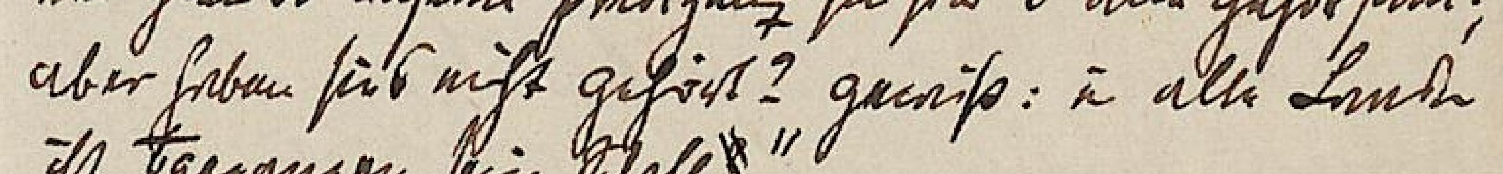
aber haben sies nicht gehört? genwiß.: in alle Lande
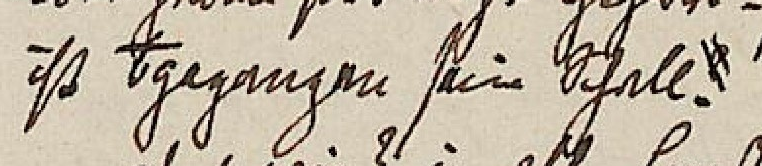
ist sgegangen sein Schall."
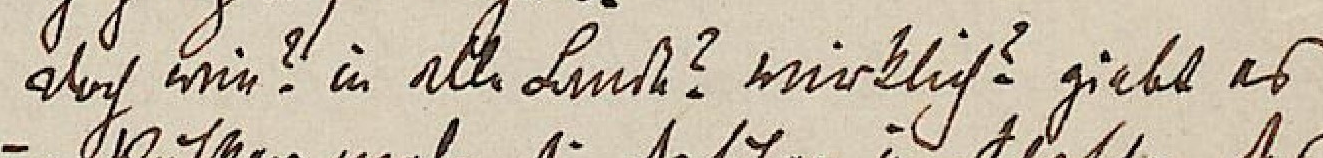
Doch wie? in alle Lande? wirklich? gibt es
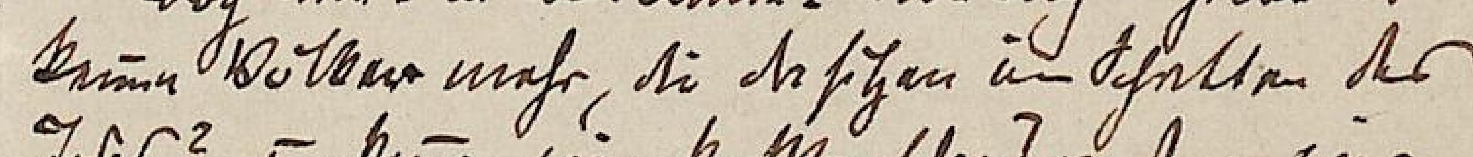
keine Völker mehr, die dasitzen im Schatten des
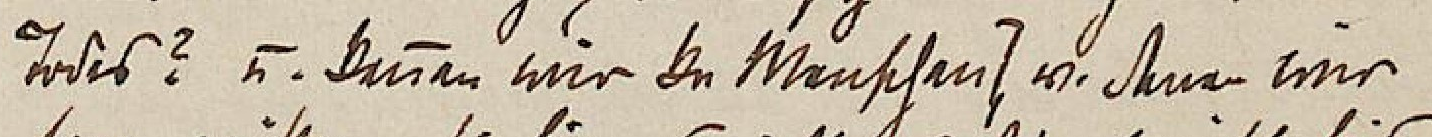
Todes? u. kenen wir kn Menschen ], v. denen wir
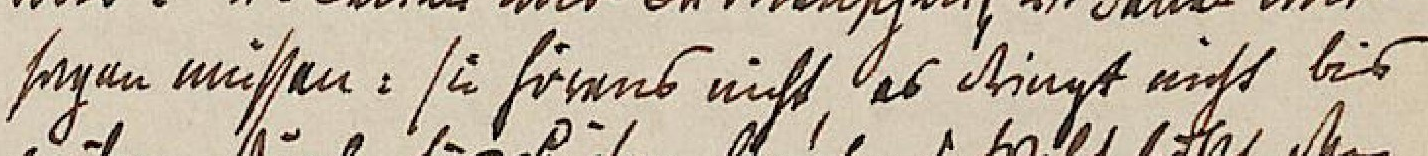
sagen müssen: sie hörens nicht, es dringt nicht bis
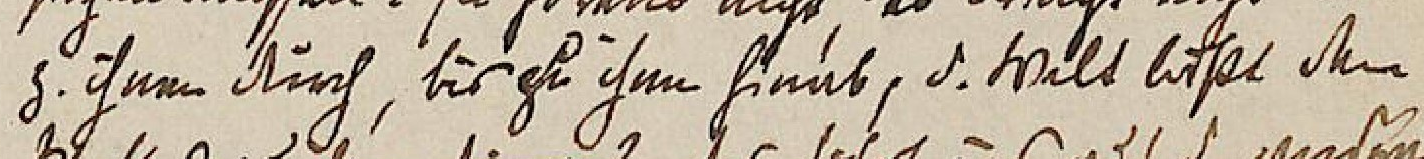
z. ihnen durch, bis zu ihnen hinab, d. Welt läßt dem
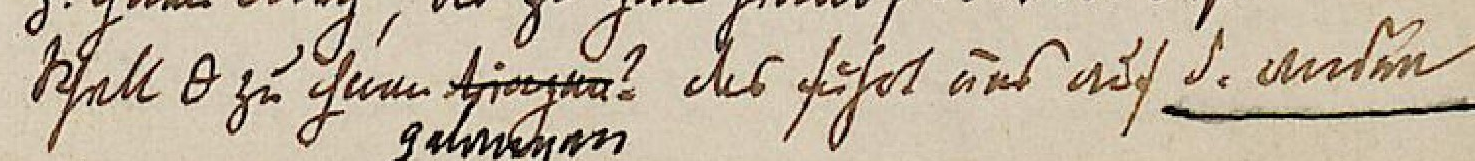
Schall o zu ihnen drönen? das führt uns auf d. anderen
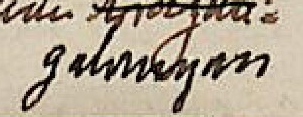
gelangen
